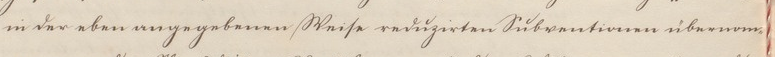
in der eben angegebenen Weise reduzirten Subventionen übernom-
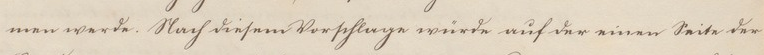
men werde. Nach diesem Vorschlage würde auf der einen Seite der
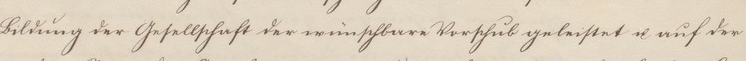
Bildung der Gesellschaft der wünschbare Vorschub geleistet & auf der
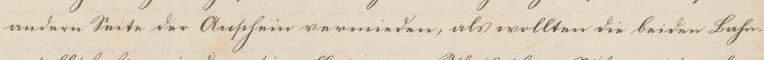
andern Seite der Anschein vermieden, als wollten die beiden Bahn-
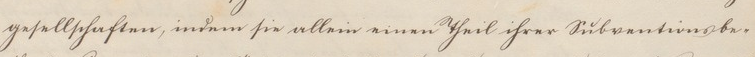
gesellschaften, indem sie allein einen Theil ihrer Subventionsbe-
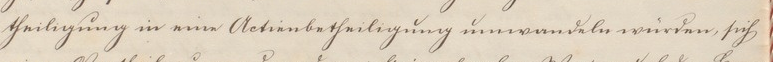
theiligung in eine Actienbetheiligung umwandeln würden, sich
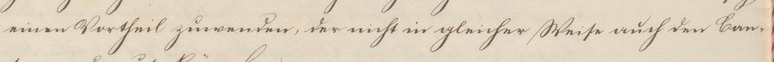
einen Vortheil zuwenden, der nicht in gleicher Weise auch den Can-
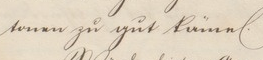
tonen zu gut käme.
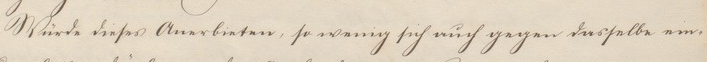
Würde dieses Anerbieten, so wenig sich auch gegen dasselbe ein-
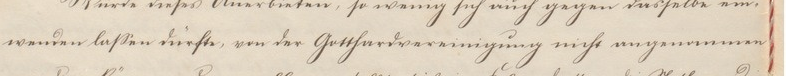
wenden lassen dürfte, von der Gotthardvereinigung nicht angenommen
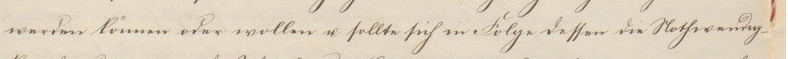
werden können oder wollen & sollte sich in Folge dessen die Nothwendig-
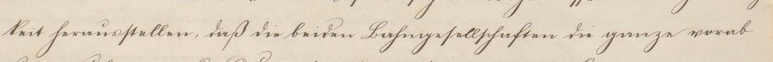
keit herausstellen, daß die beiden Bahngesellschaften die ganze vorab
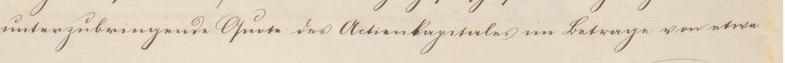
unterzubringende Quote des Actienkapitales im Betrage von etwa
